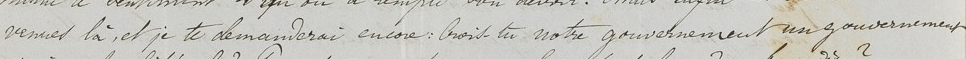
venues là, et je te demanderai encore: Crois-tu notre gouvernement un gouvernement
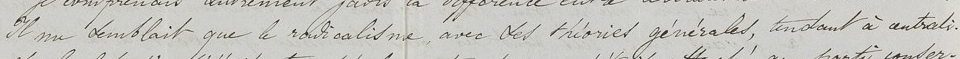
Il me semblait que le radicalisme, avec ses théories générales, tendant à centrali-
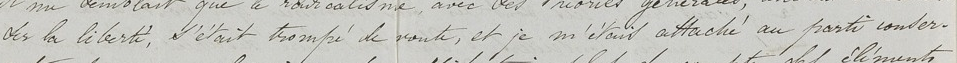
ser la liberté, s'était trompé de route, et je m'étais attaché au parti conser-
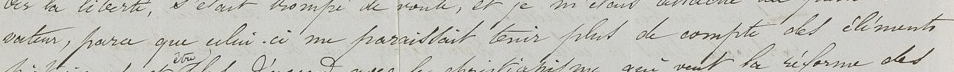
vateur, parce que celui-ci me paraissait tenir plus de compte des éléments
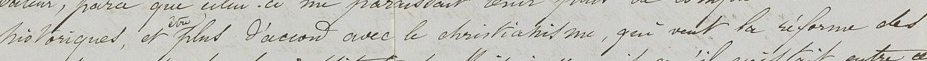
historiques, et être plus d'accord avec le christianisme, qui veut la réforme des
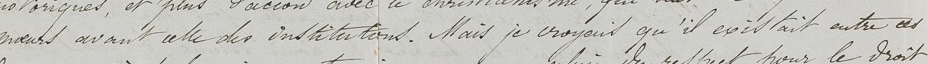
mœurs avant celle des institutions. Mais je croyais qu'il existait entre ces
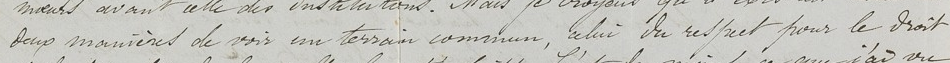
deux manières de voir un terrain commun, celui du respect pour le droit
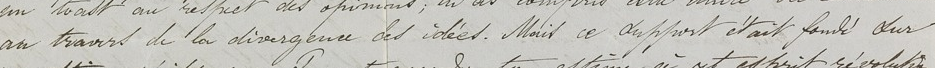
au travers de la divergence des idées. Mais ce support était fondé sur
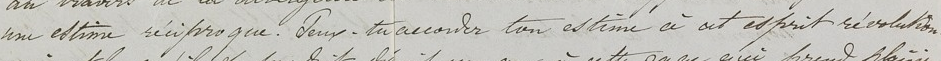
une estime réciproque. Peux-tu accorder ton estime à cet esprit révolution-
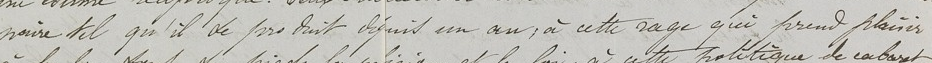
naire tel qu'il se produit depuis un an; à cette rage qui prend plaisir
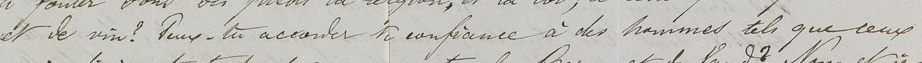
et de vin? Peux-tu accorder ta confiance à des hommes tels que ceux
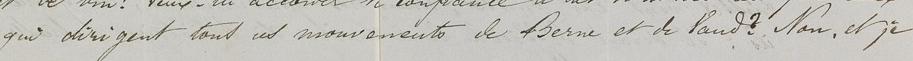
qui dirigent tous ces mouvements de Berne et de Vaud? Non, et je
